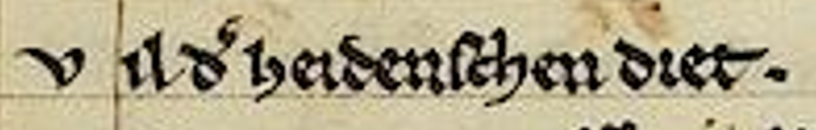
Vil d(er) heidenſchen diet.
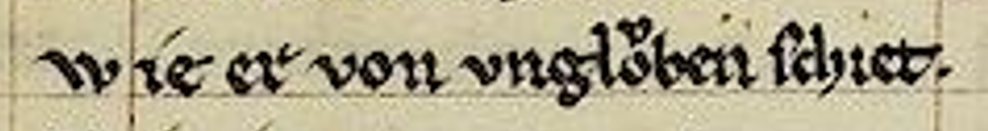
Wie er von vnglo°vben ſchiet.
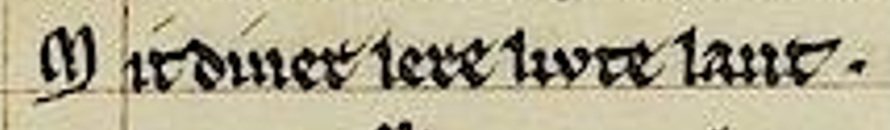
Mit diner lere livte lant.
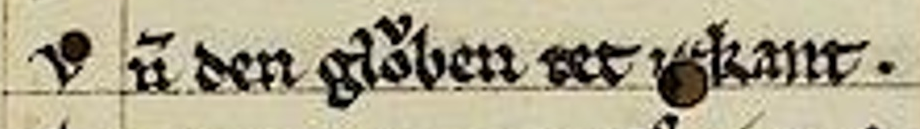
Vn(d) den glo°uben tet irkant.
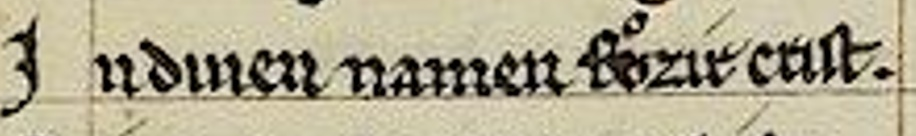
In dinen namen ſv°ozir criſt.
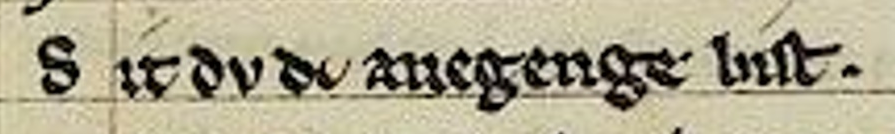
Sit dv d(az) anegenge biſt.
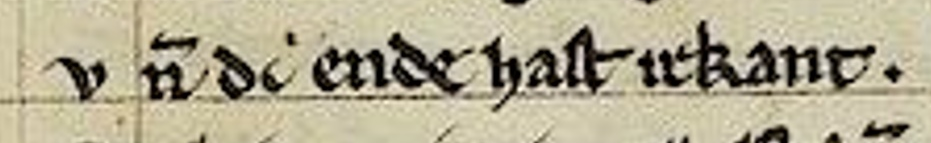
Vn(d) d(az) ende haſt irkant.
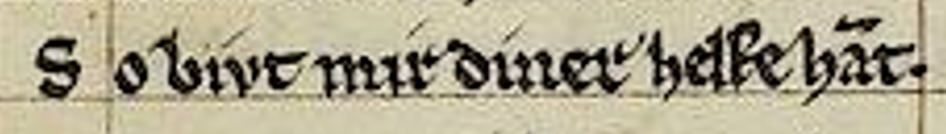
So bivt mir diner helfe ha(n)t.
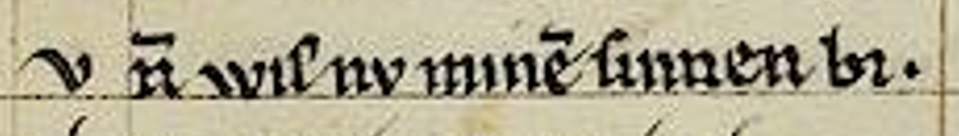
Vn(d) wiſ nv mine(n) ſinnen bi.
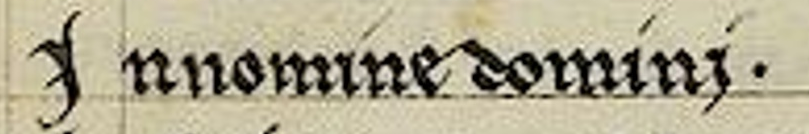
In nomine domini.
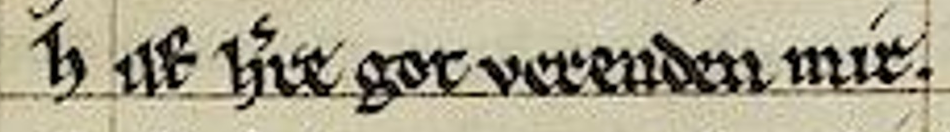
Hilf h(er)re got verenden mir.
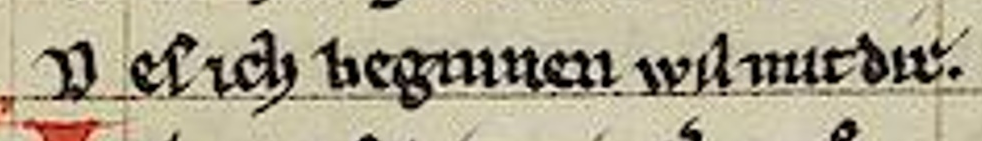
Deſ ich beginnen wil mit dir.
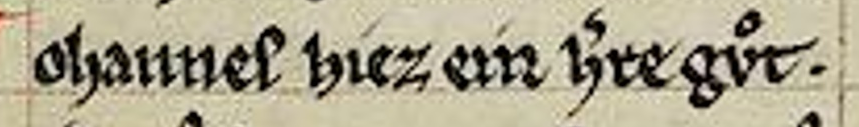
**Iohanneſ hiez ein h(er)re gv°ot.
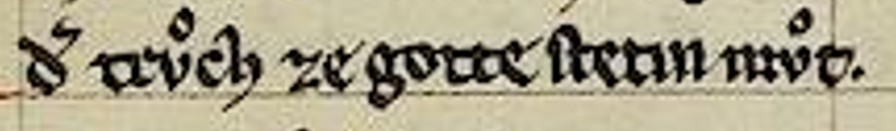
d(er) trv°och ze gotte ſtetin mv°ot.
